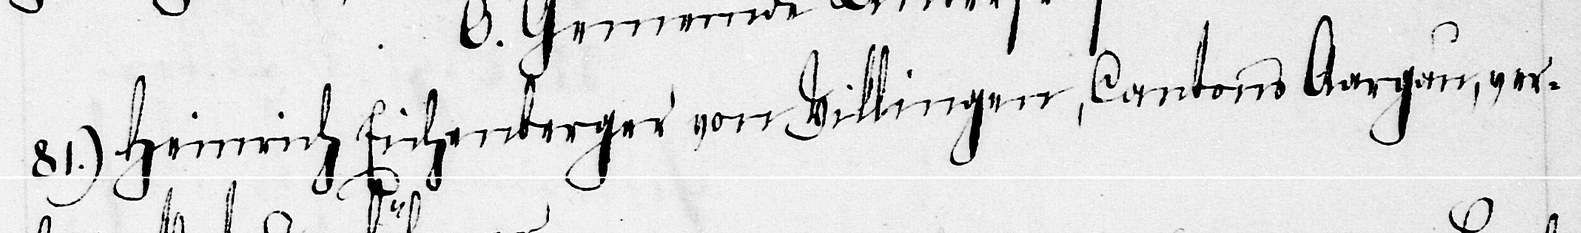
81.) Heinrich Eichenberger von Villingen, Cantons Aargau, ver¬
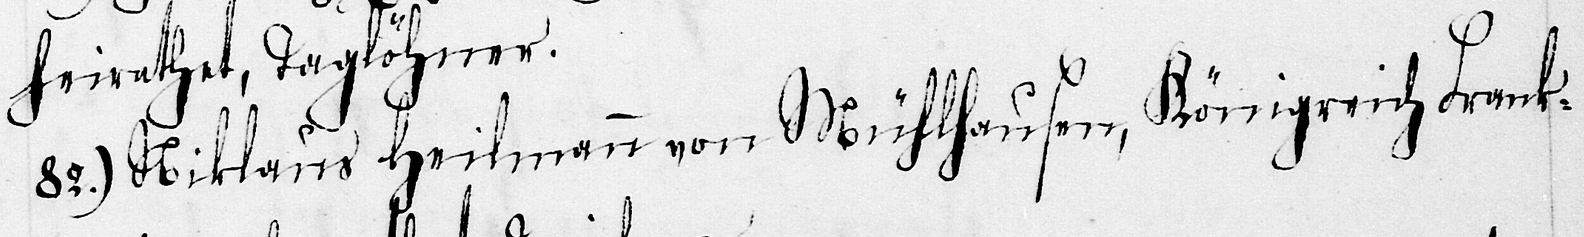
82.) Niklaus Heilmann von Mühlhausen, Königreich Frank¬
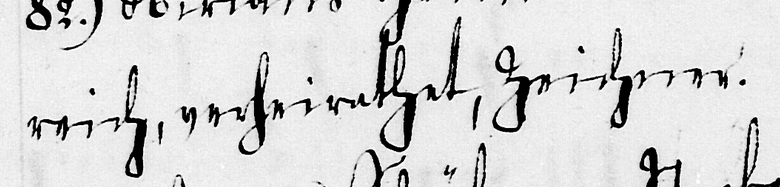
reich, verheirathet, Zeichner.
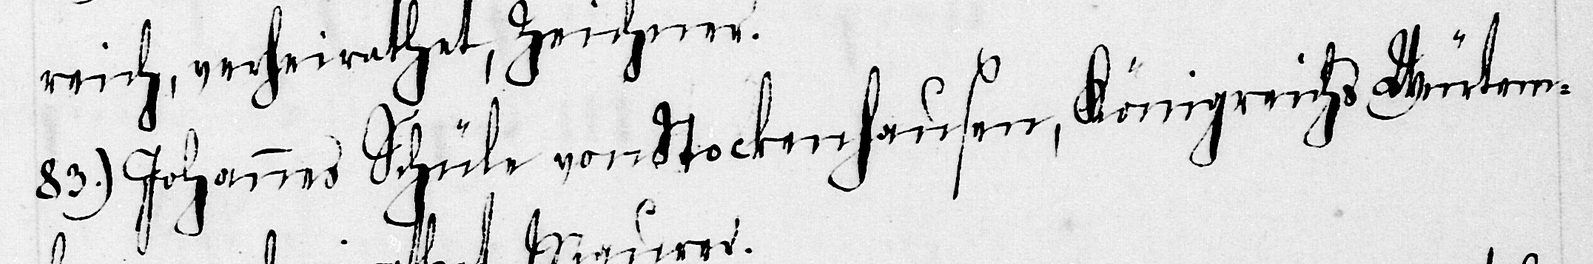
83.) Johannes Schüle von Stockenhausen, Königreichs Würtem¬
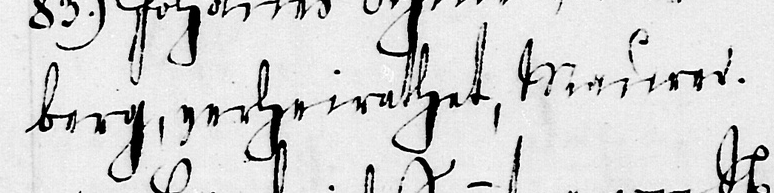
berg, verheirathet, Maurer.
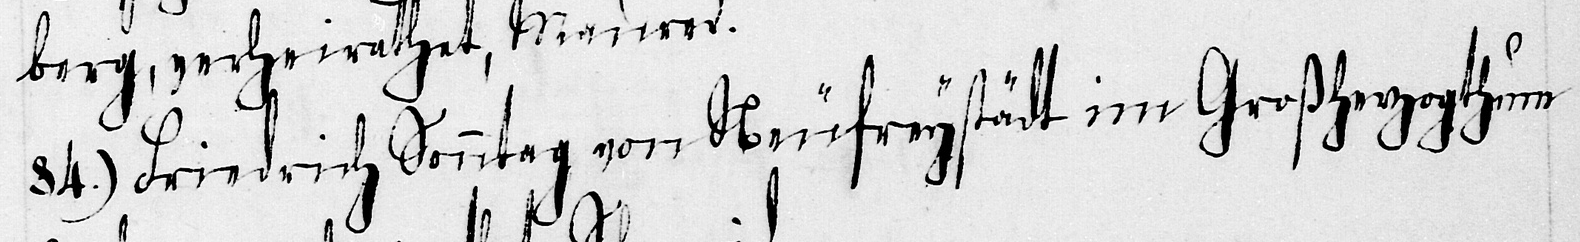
84.) Friedrich Sonntag von Neufreystädt im Großherzogthum
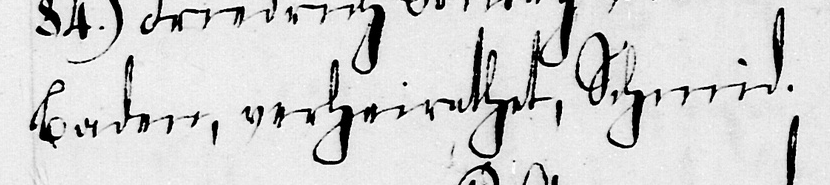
Baden, verheirathet, Schmid.
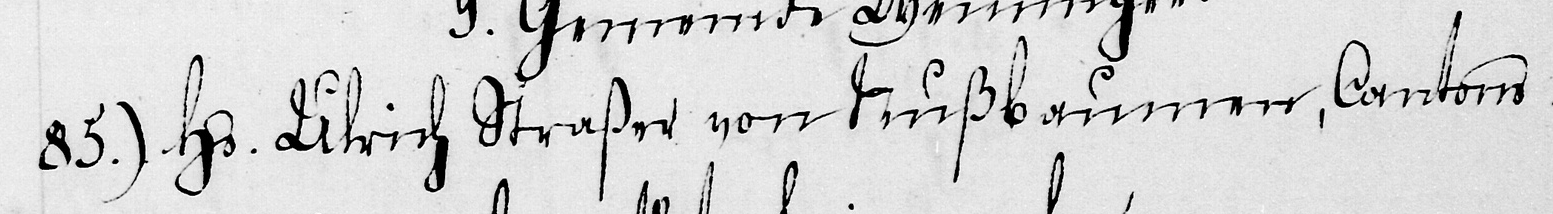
85.) Hs. Ulrich Straßer von Nußbaumen, Cantons
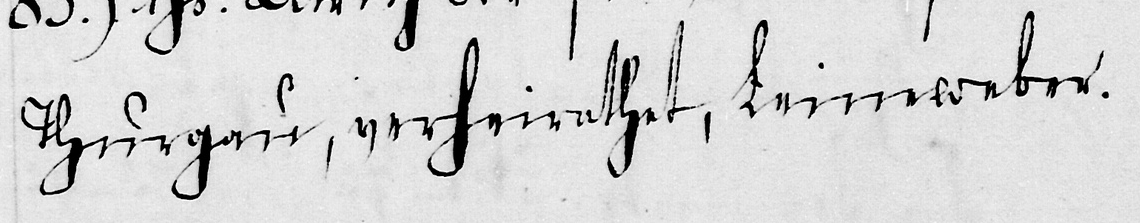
Thurgau, verheirathet, Leineweber.
